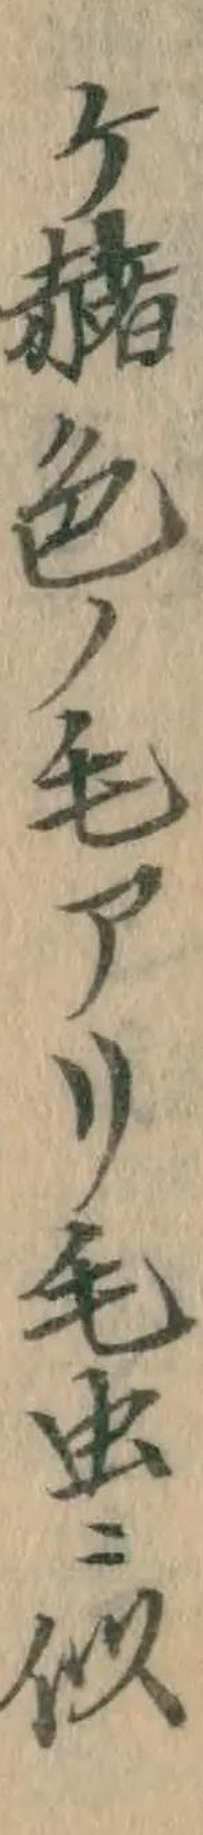ケ赭色ノ毛アリ毛虫ニ似
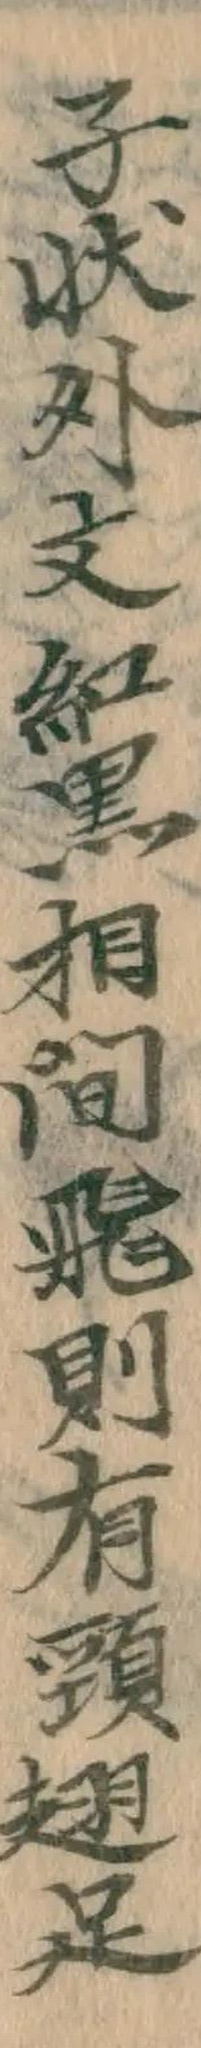子状外文紅黒藍相間飛則有頭翅足
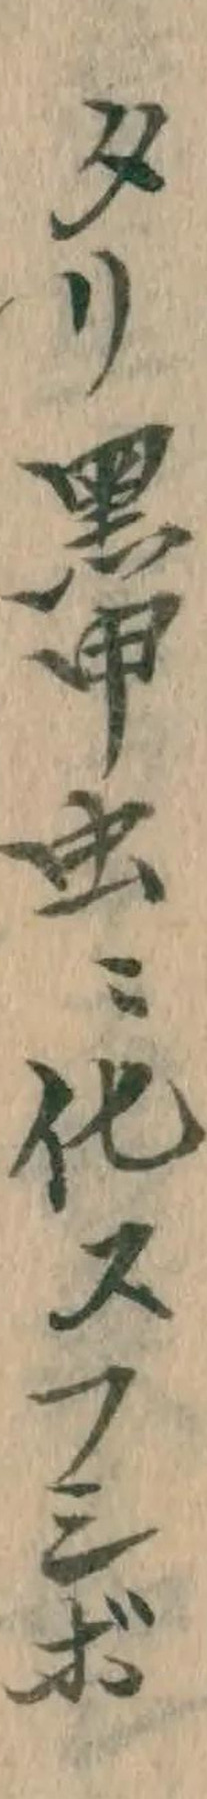タリ黒甲虫ニ化スフシボ
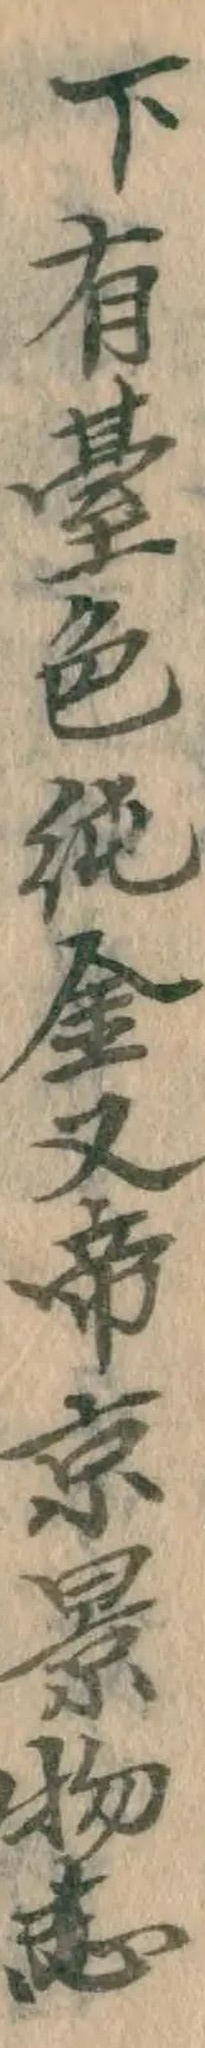下有臺色純金又帝京景物志
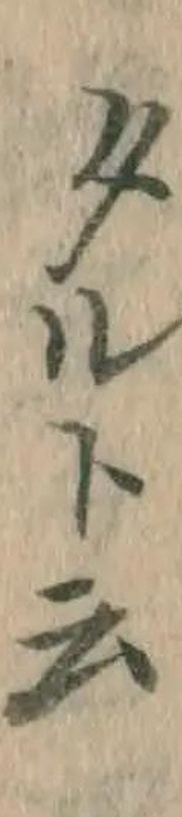タルト云
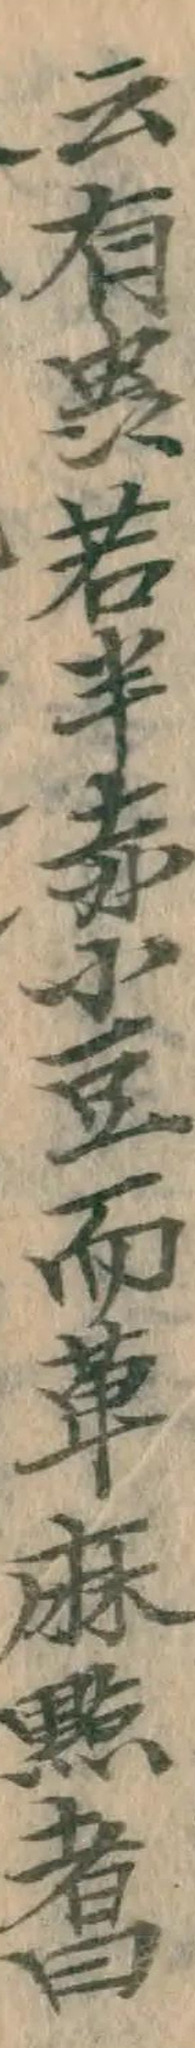云有蟲若半赤小豆而草麻點者曰
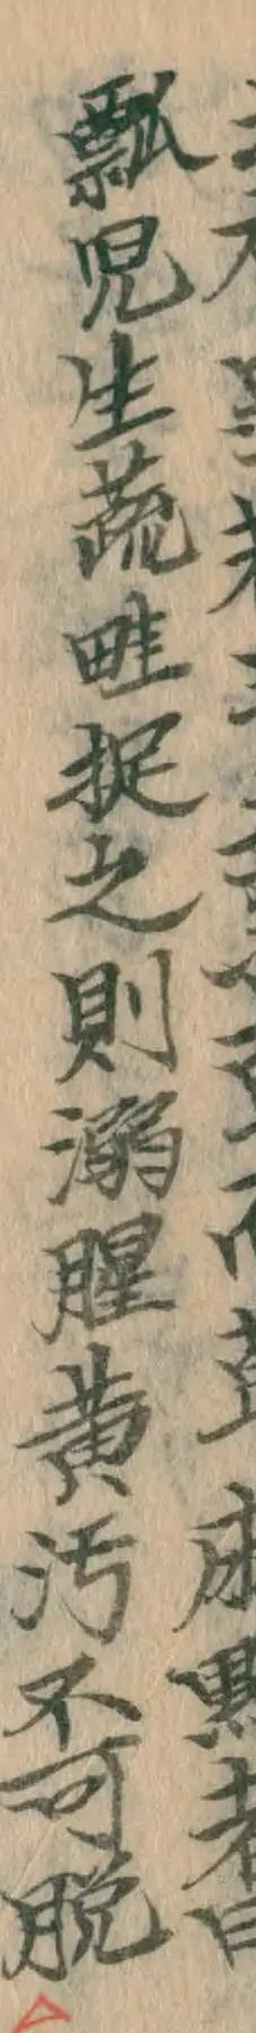瓢児生蔬畦捉之則溺腥黄汚不可脱△
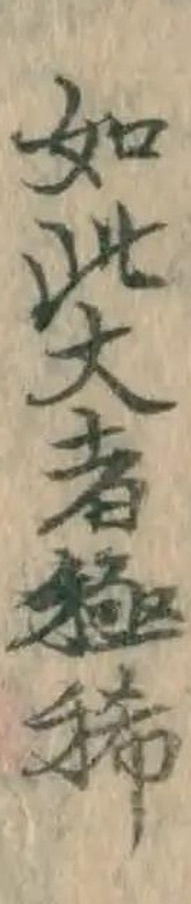如此大者極稀
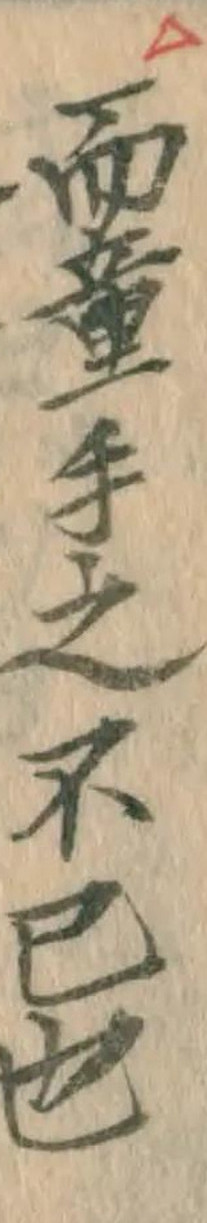而童手之不巳也
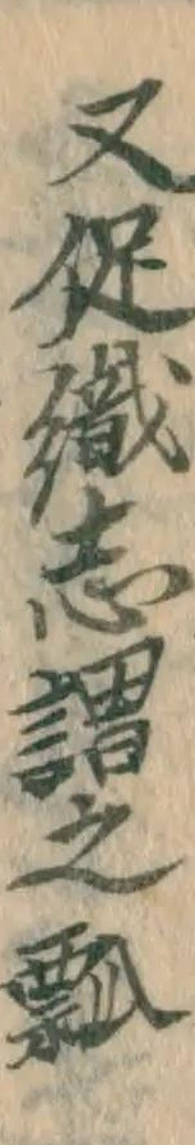又促織志謂之瓢
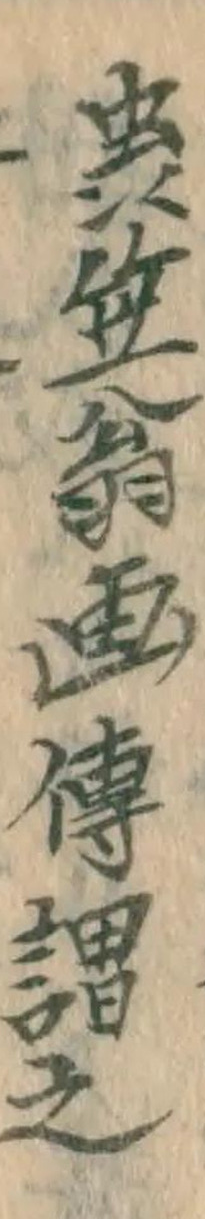蟲笠翁画傳謂之

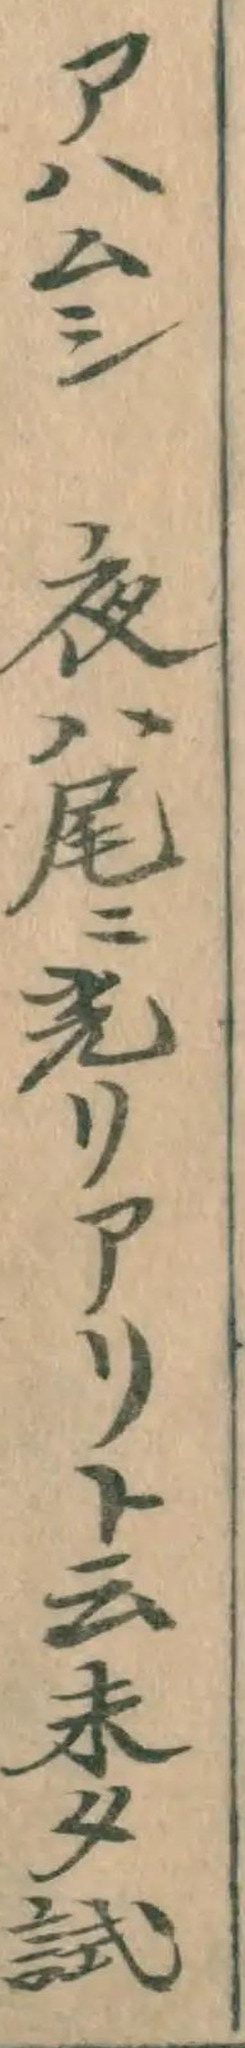アハムシ夜ハ尾ニ光リアリト云未タ試
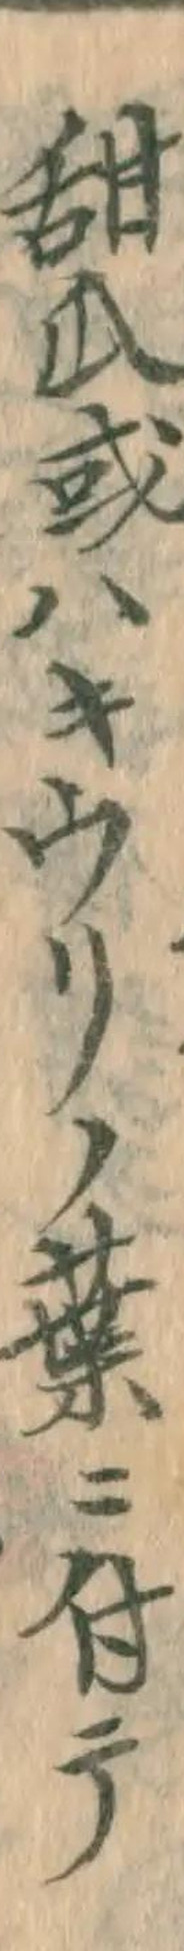甜瓜或ハキウリノ葉ニ付テ
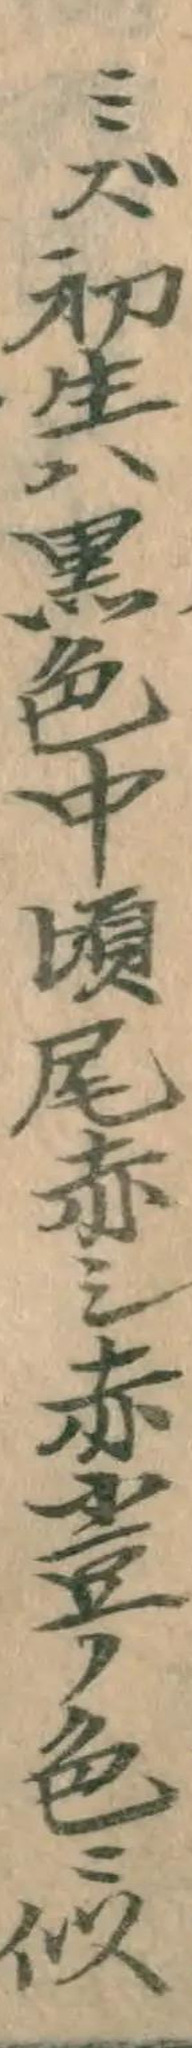ミズ初生ハ黒色中頃尾赤シ赤小豆ノ色ニ似
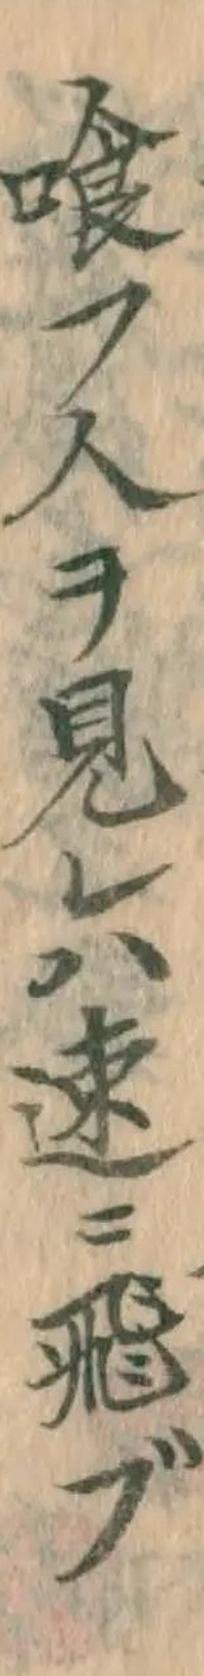喰フ人ヲ見レハ速ニ飛ブ
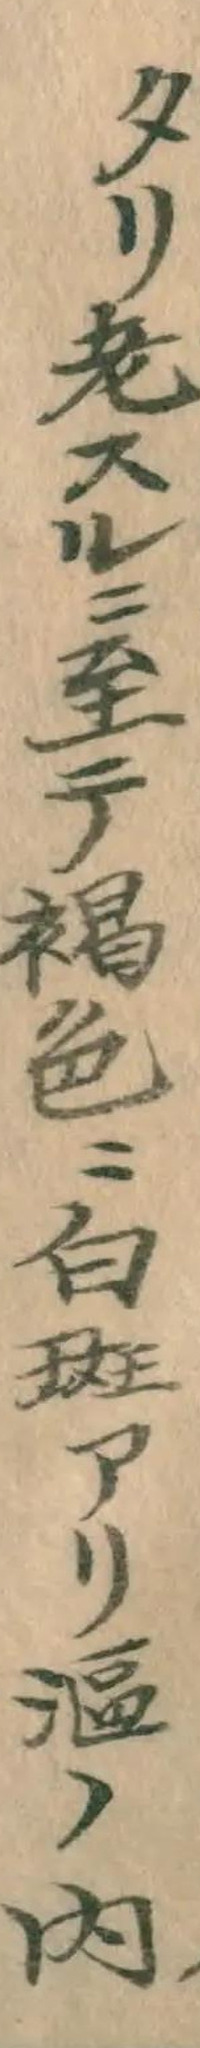タリ老スルニ至テ褐色ニ白斑アリ漚ノ内
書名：千蟲譜 3巻. [2]
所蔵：国立国会図書館 National Diet Library, JAPAN
